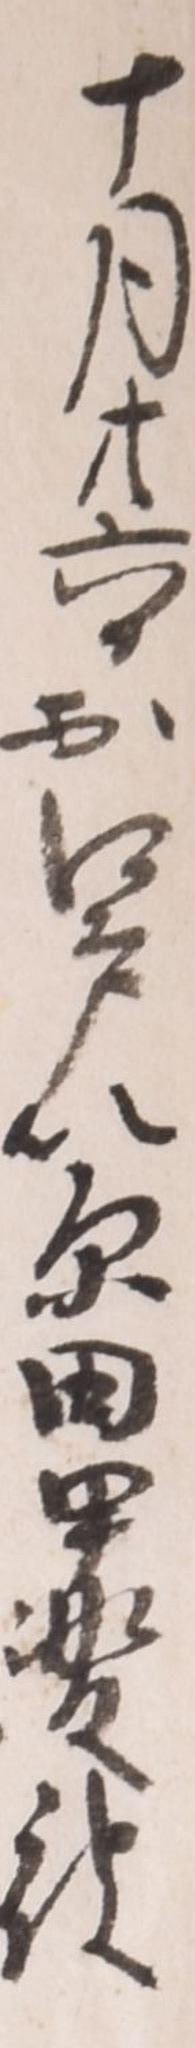十月廿六日於江戸以原田甲斐被
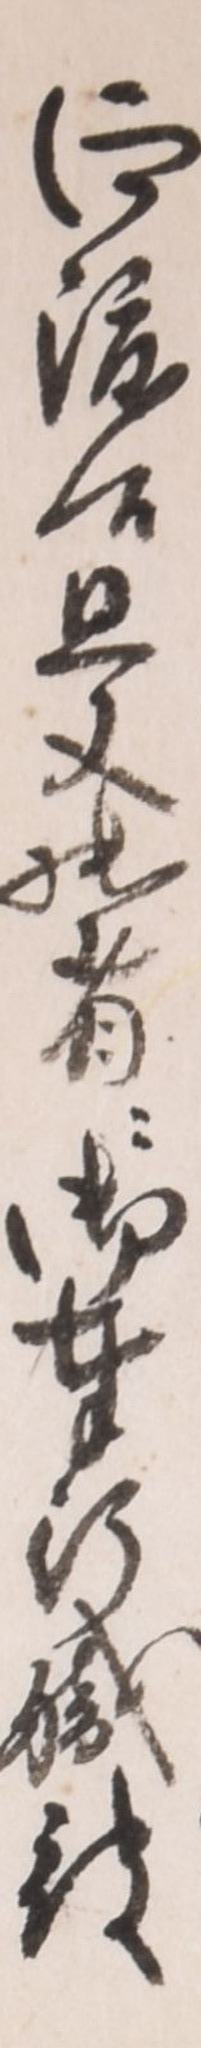仰渡候且又拙者に御奉行職被
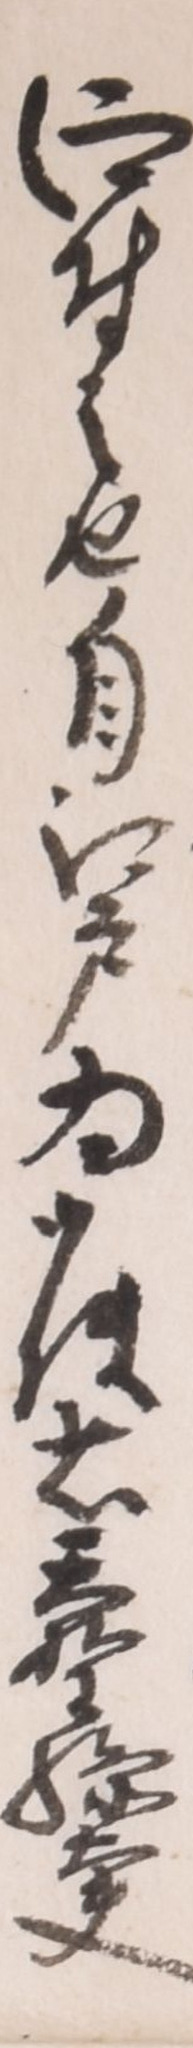仰付之由自江戸為御使者天野孫大夫
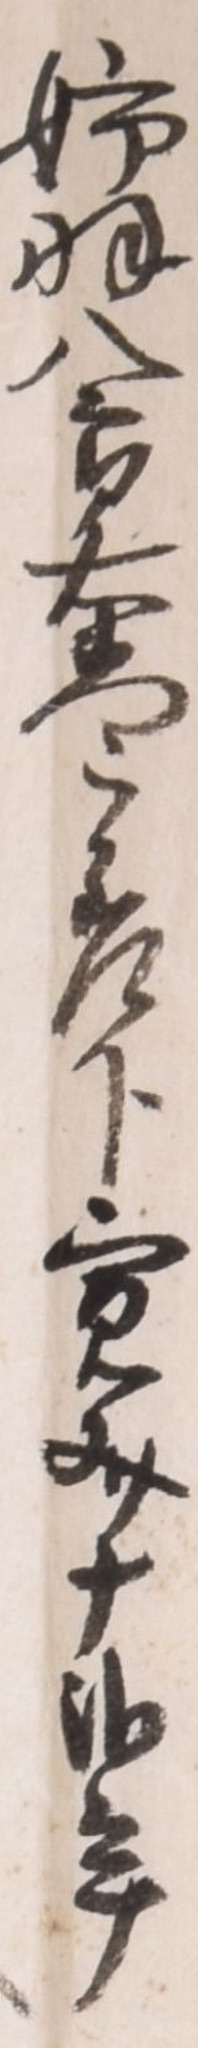姉羽八郎右衛門被差下寛文十弐年
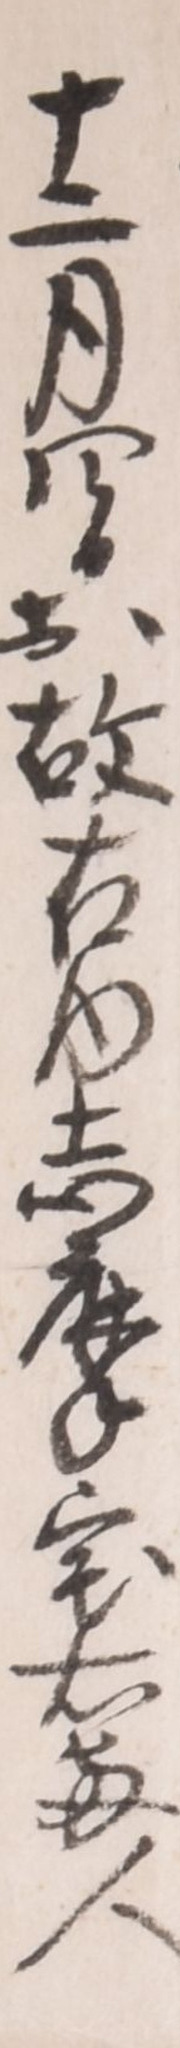十二月四日於故古内志摩宅右両人
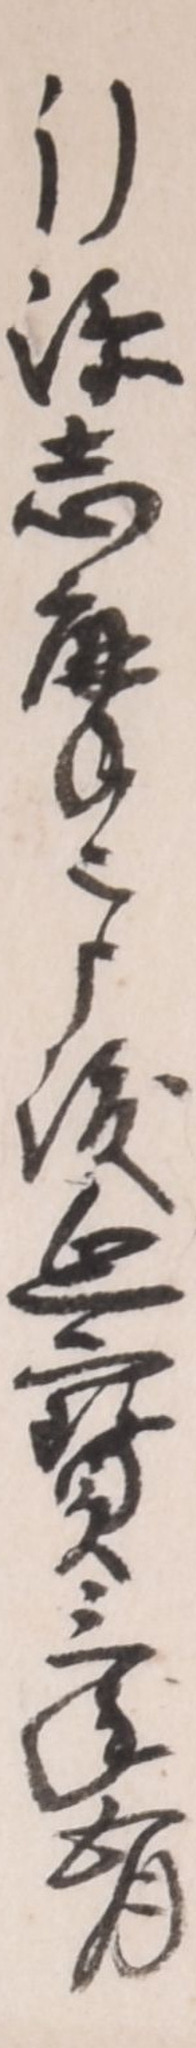引添志摩被申渡延宝三年五月
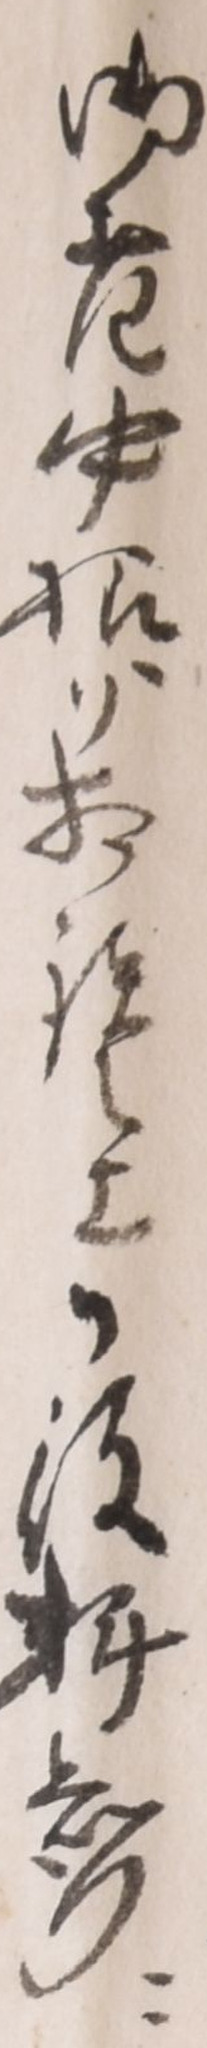御老中様へ御相談之上御役料知行に
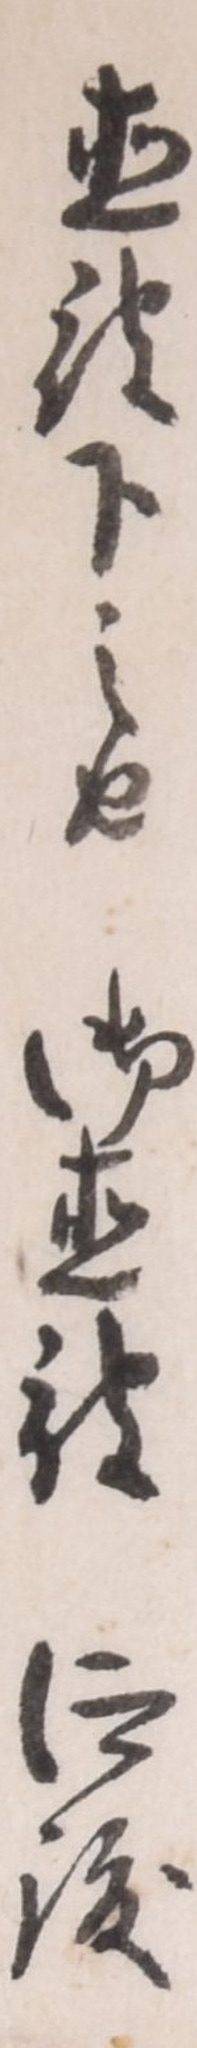直被下之由御直被仰渡
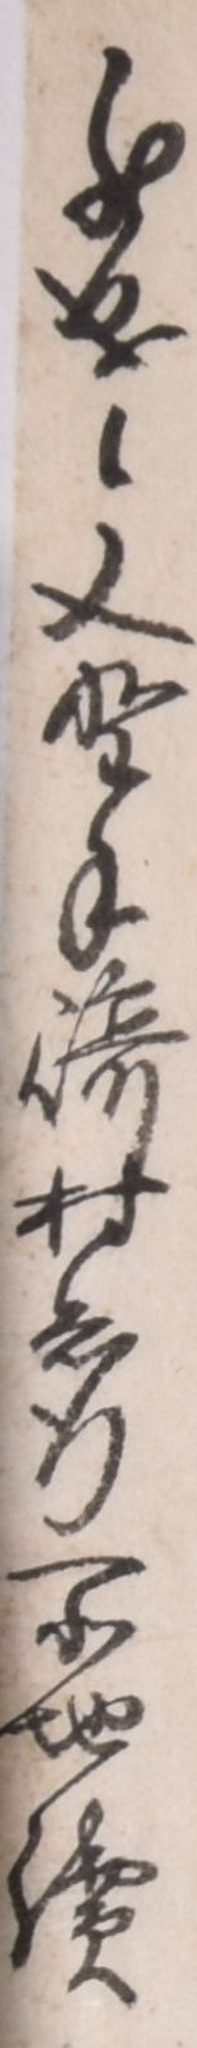罷成候又野手崎村知行所地続
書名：「拙者先祖自小梁川中務太輔盛宗〜」
